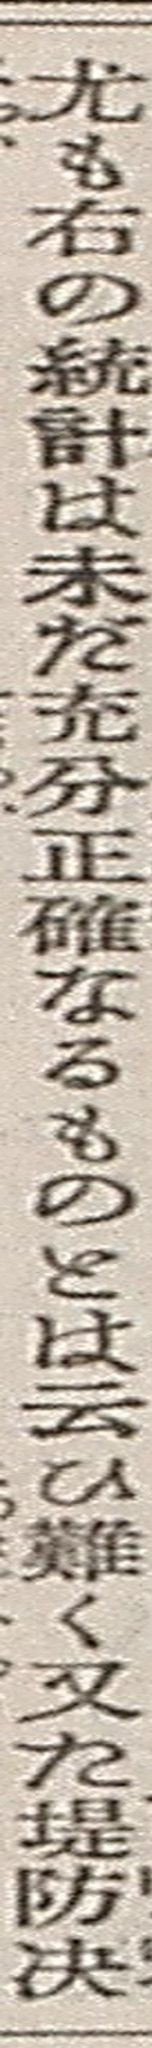尤も右の統計は未だ充分正確をなるものとは云ひ難く又た堤防决
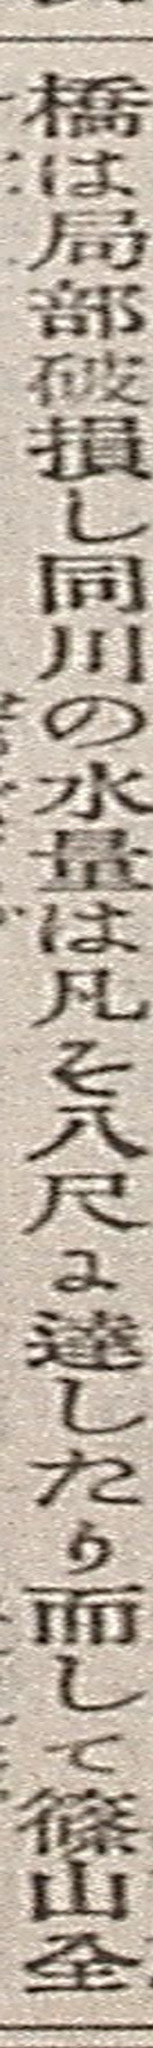橋は局部破損し同川の水量は凡そ八尺に達したり而して篠山全
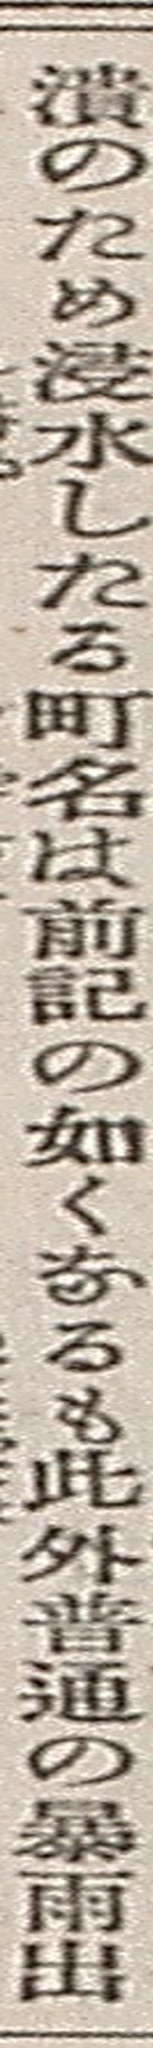潰のため浸水したる町名は前記の如くなるも此外普通の暴雨出
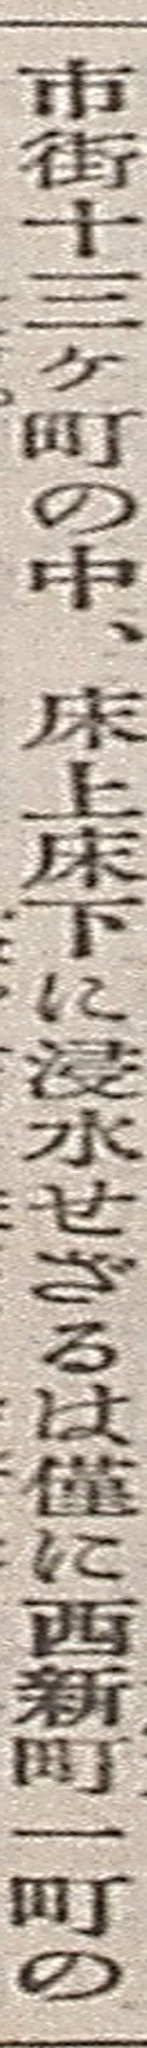市街十三ヶ町の中、床上床下に浸水せざるは僅に西新町一町の
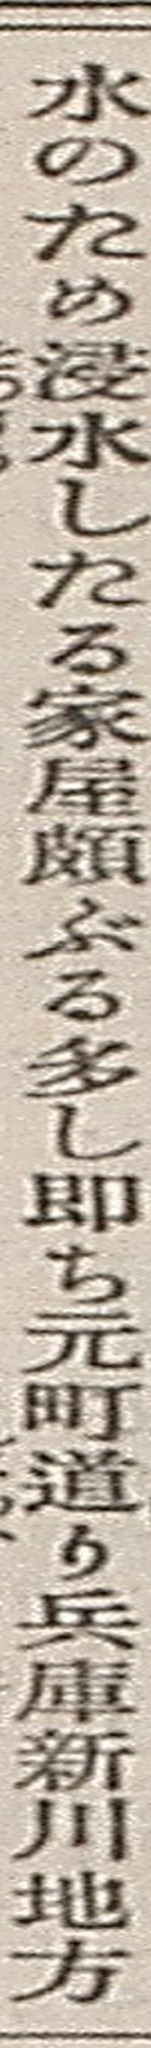水のため浸水したる家屋頗ぶる多し即ち元町道り兵庫新川地方
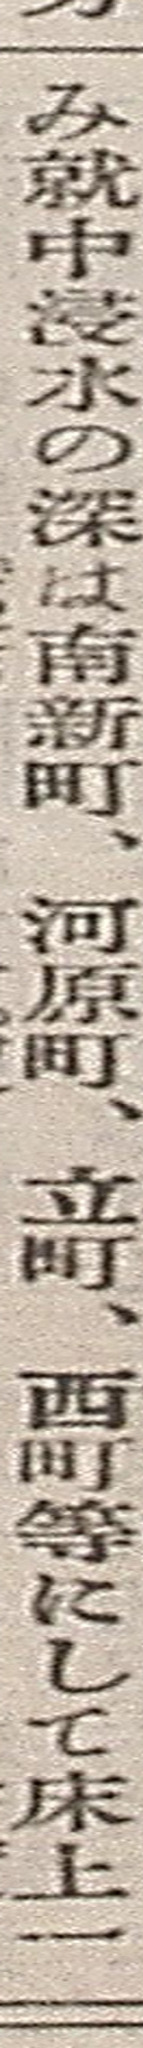み就中浸水の深は南新町、河原町、立町、西町等にして床上一
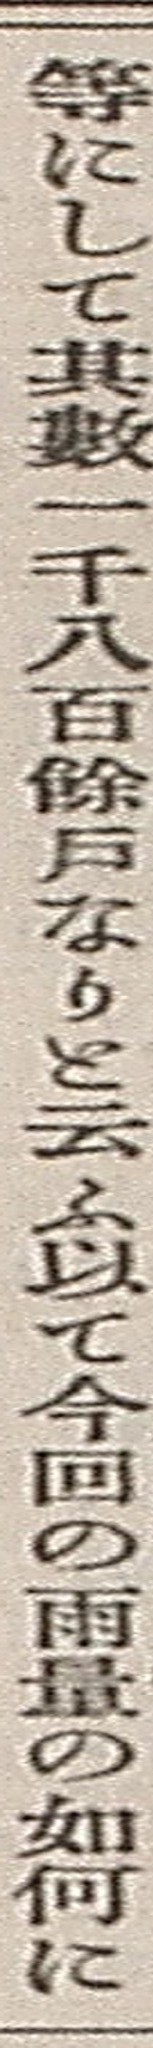等にして其数一千八百餘戸なりと云ふ以て今回の雨量の如何に
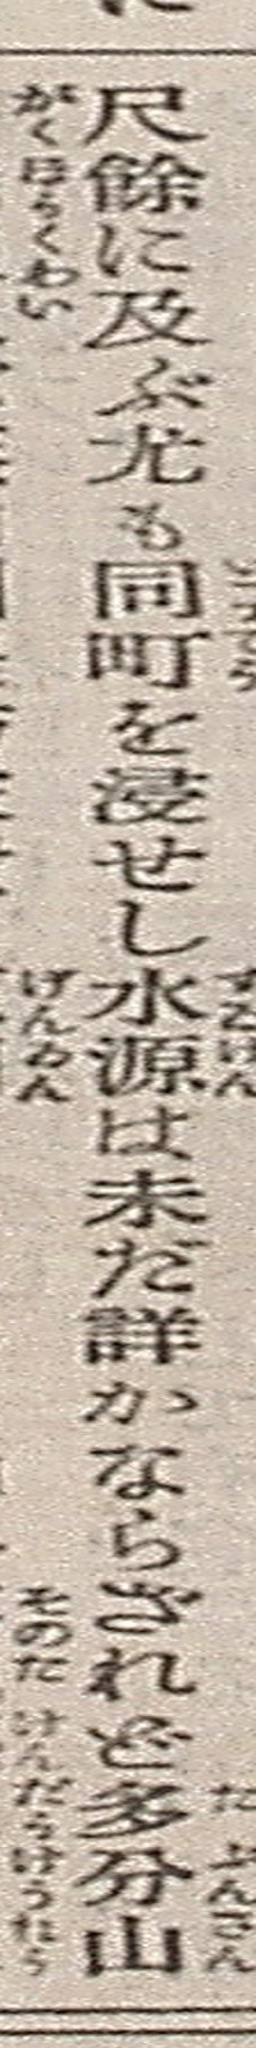尺餘に及ぶ尤も同町を浸せし水源は未だ詳かならざれど多分山
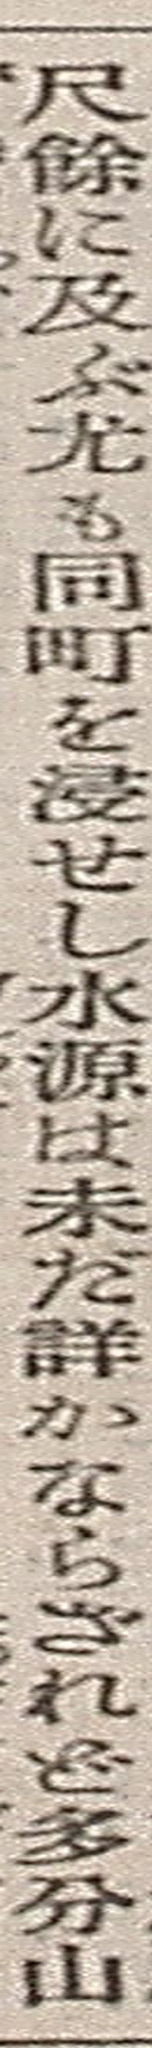尺餘に及ぶ尤も同町を浸せし水源は未だ詳かならざれど多分山
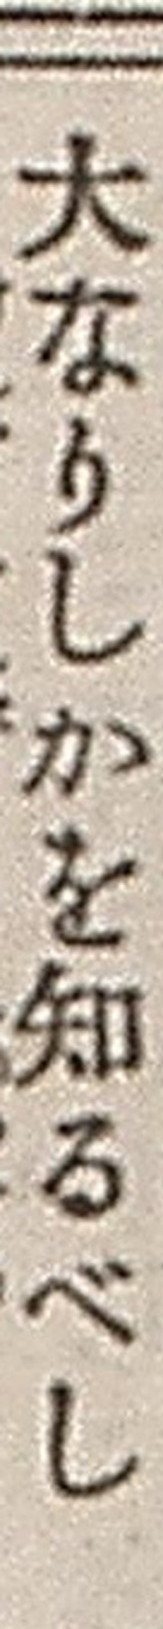大なりしかを知るべし
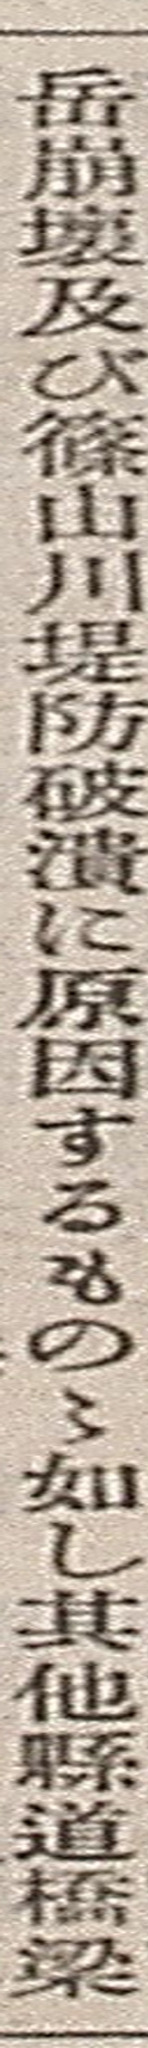岳崩壊及び篠山川堤防破潰に原因するものゝ如し其他県道橋梁
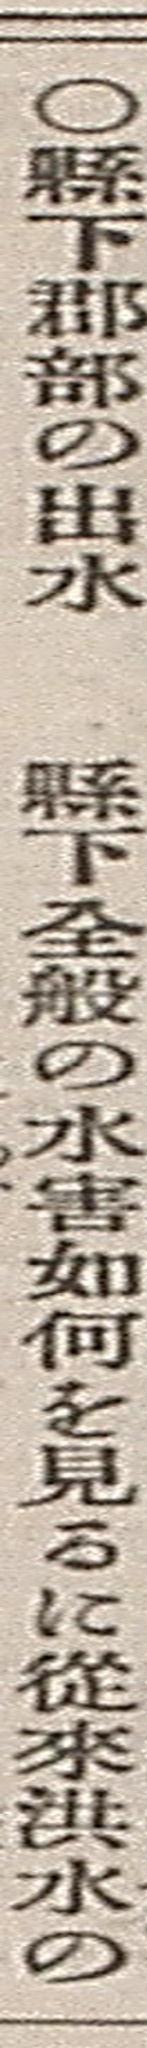◯縣下郡部の出水縣下全般の水害如何を見るに従来洪水の
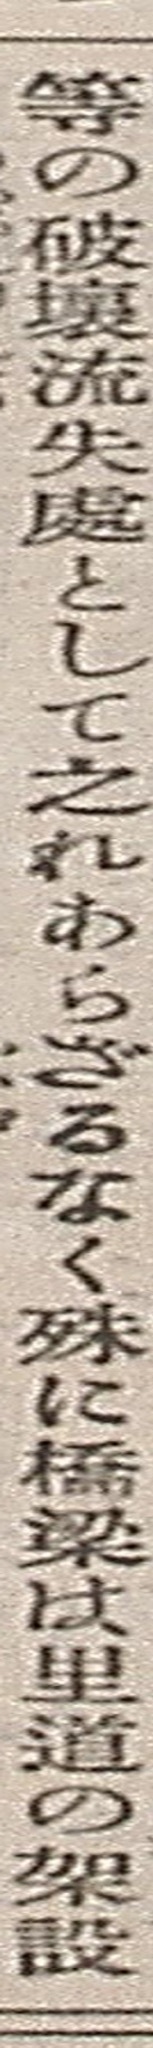等の破壊流失処として之れあらざるなく殊に橋梁は里道の架設
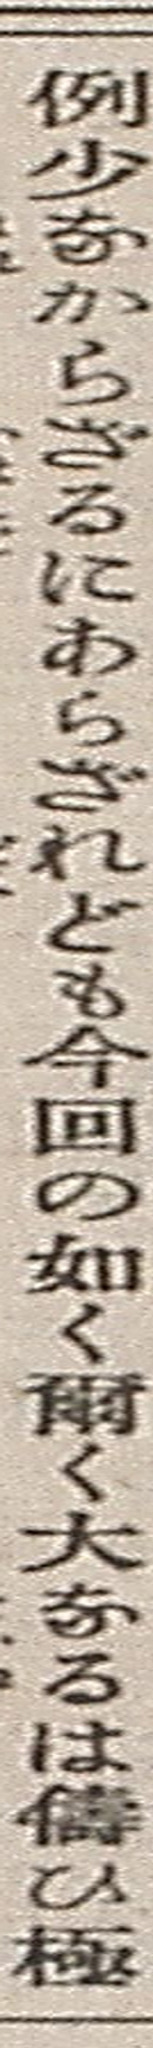例少なかざるにあらざれども今回の如く爾く大なるは畴ひ極
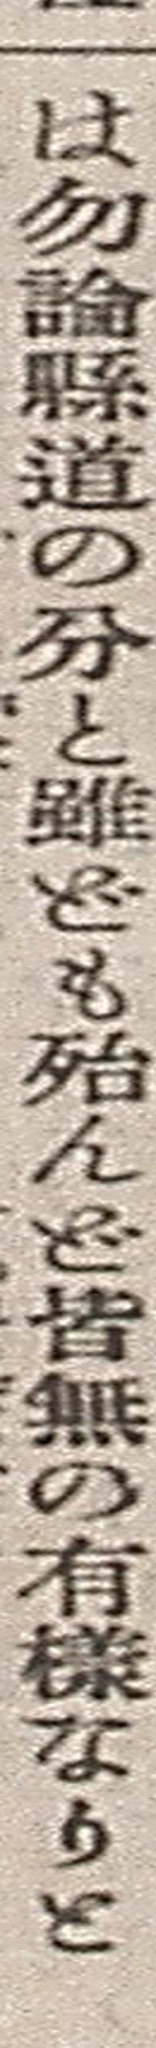は勿論県道の分と雖も殆んど皆無の有様なりと
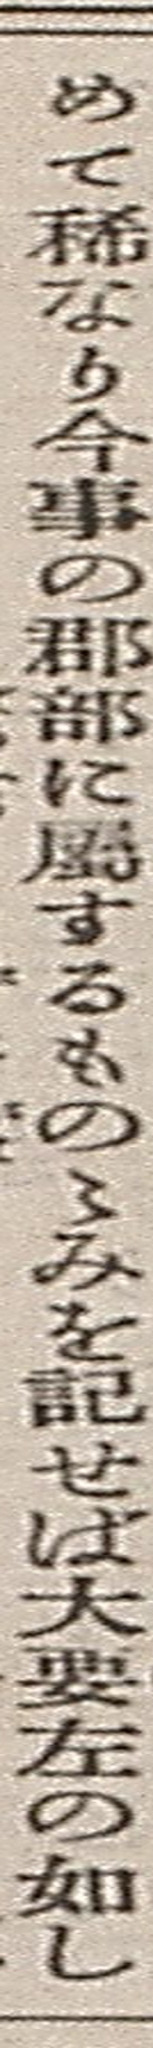めて稀なり今事の郡部に属するものゝみを記せば大要左の如し
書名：風俗畫報臨時増刊第百二十八號　洪水被害録（下）
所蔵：東京大学地震研究所図書室 Earthquake Research Institute Library, The University of Tokyo, JAPAN
